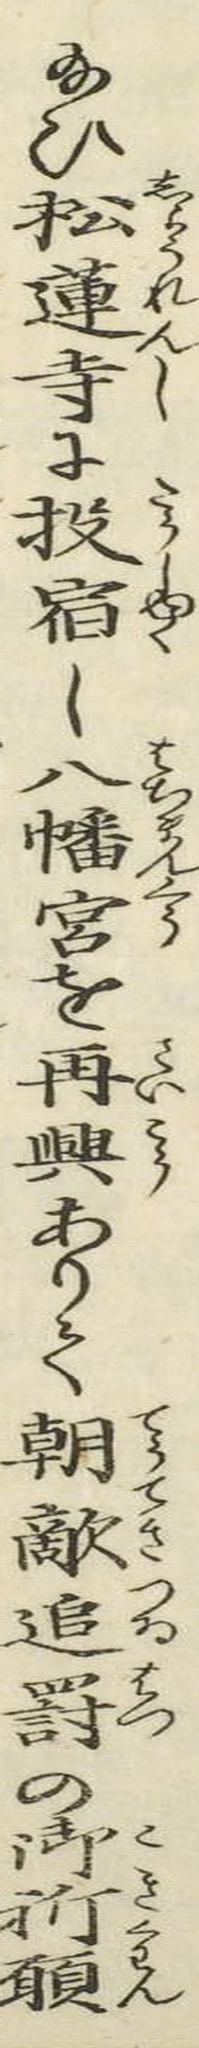給ひ松蓮寺に投宿し八幡宮を再興ありて朝敵追罰の御祈願
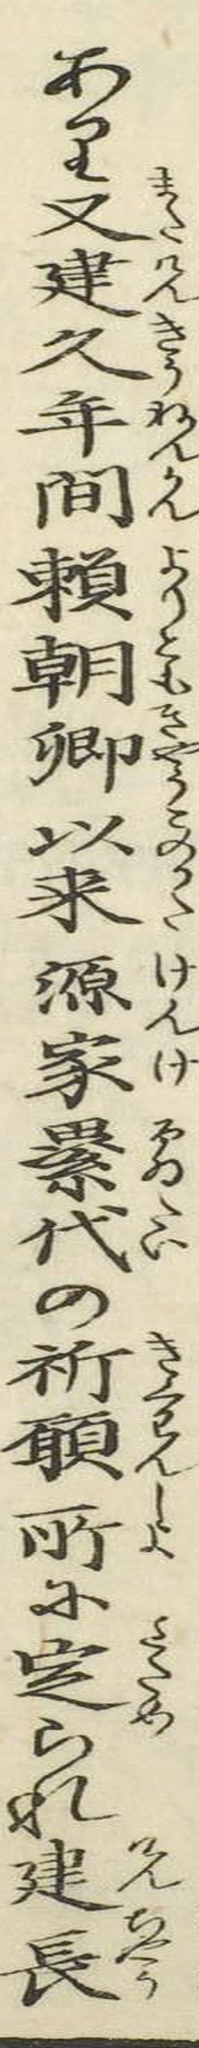あり又建久年間頼朝卿以来源家累代の祈願所に定られ建長
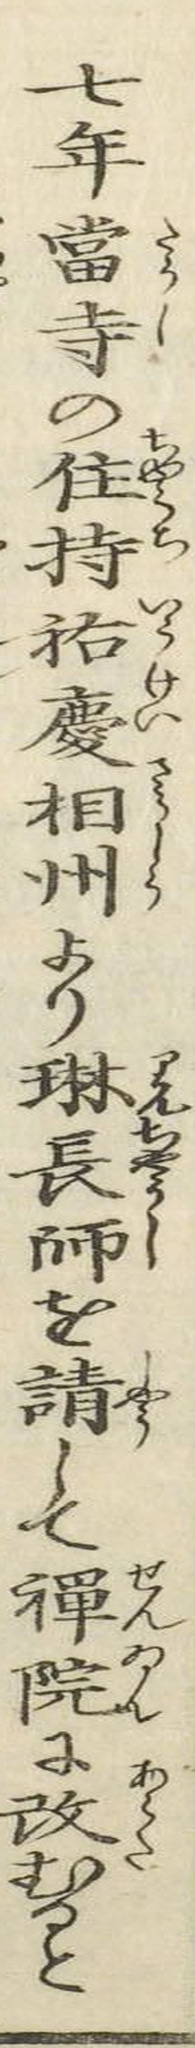七年当寺の住持祐慶相州より琳長師を請して禅院に改むると
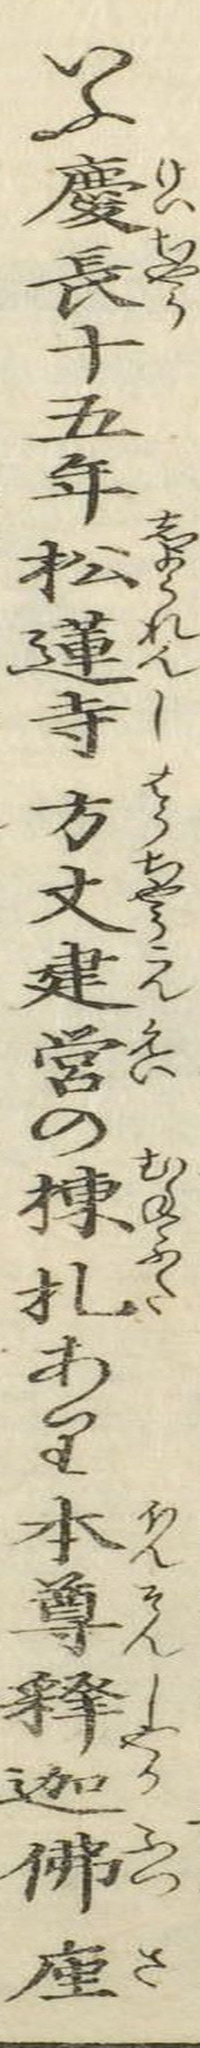いふ慶長十五年松蓮寺方丈建営の棟札あり本尊釈迦佛座
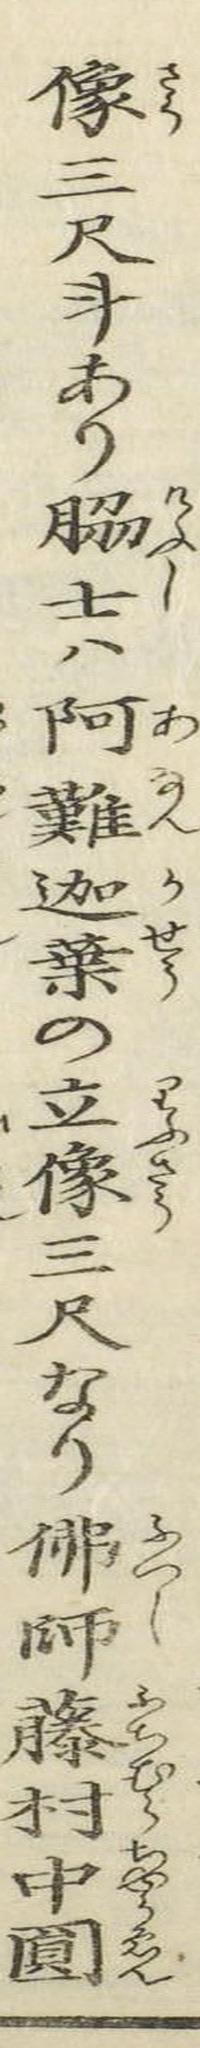像三尺斗あり脇士は阿難迦葉の立像三尺なり仏師藤村中円
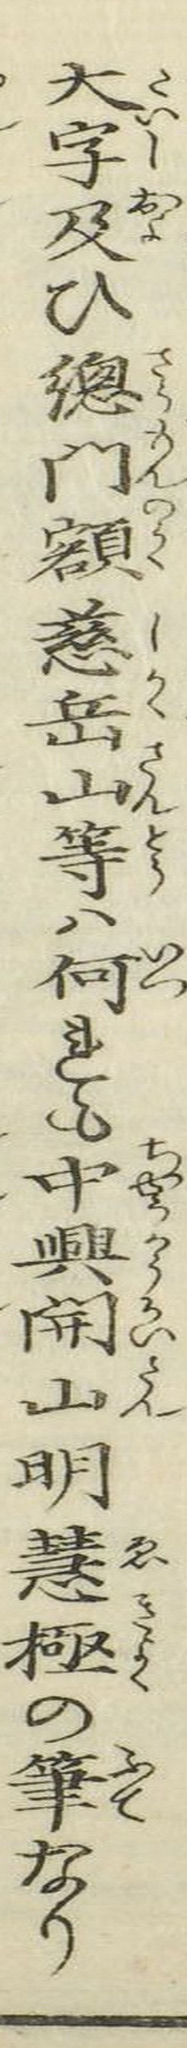大字及ひ総門額慈岳山等は何れも中興開山明慧極の筆なり
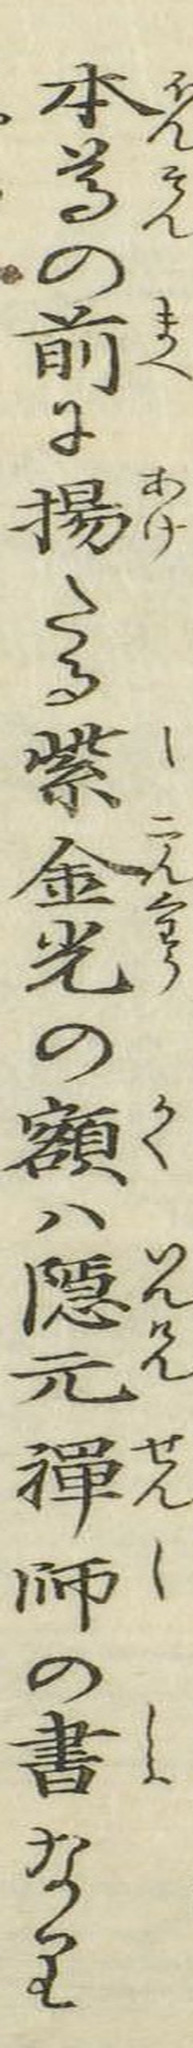本尊の前に揚たる紫金光の額は隠元禅師の書なり
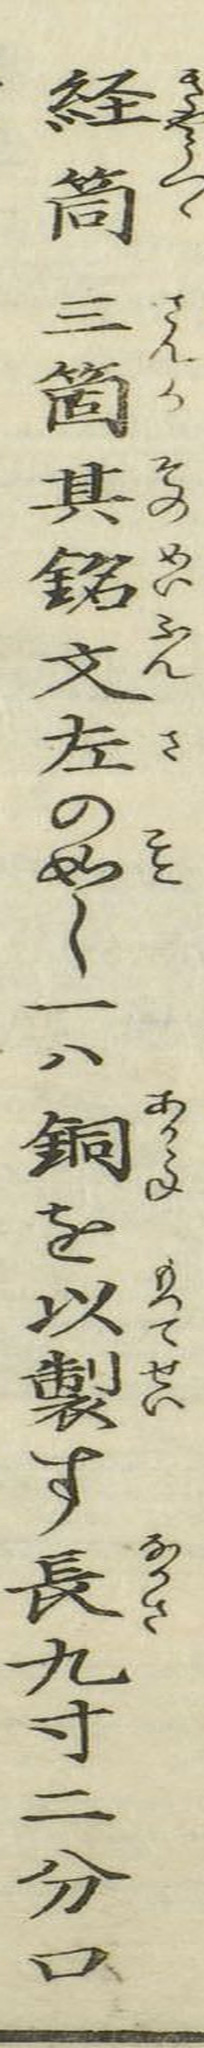経筒三箇其銘文左の如し一は銅を以製す長九寸二分口
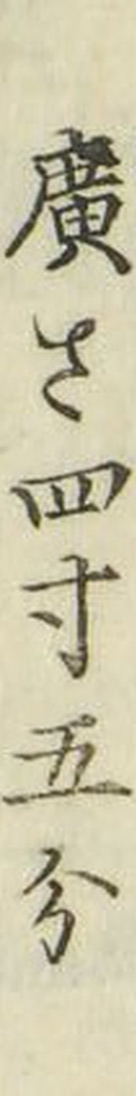広さ四寸五分
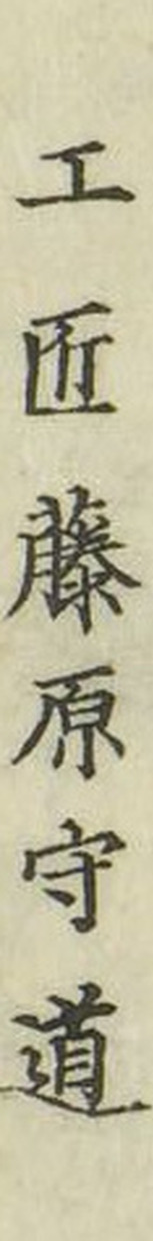工匠藤原守道

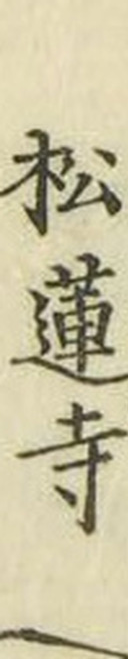松蓮寺
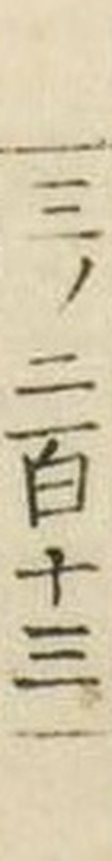三の二百十三

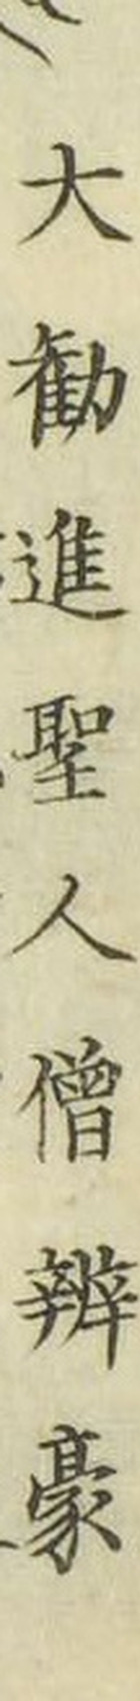大勧進聖人僧辨豪
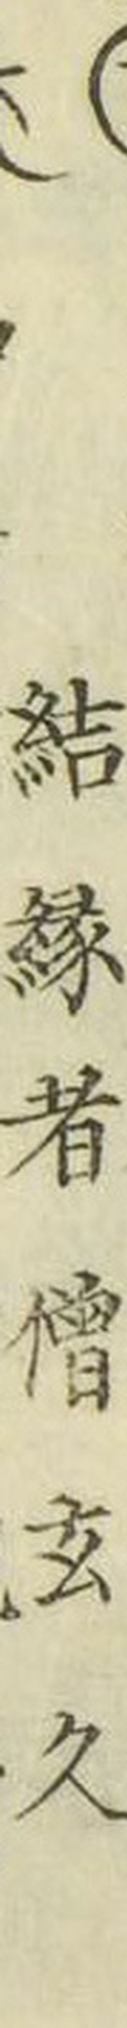結縁者僧玄久
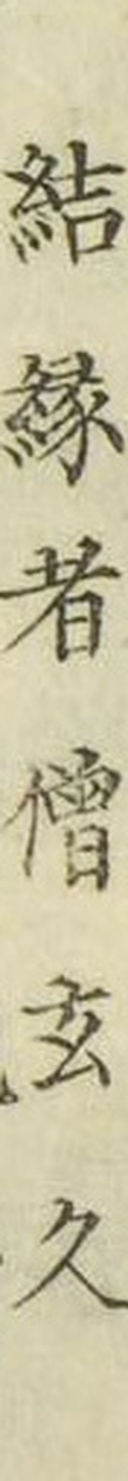結縁者僧玄久
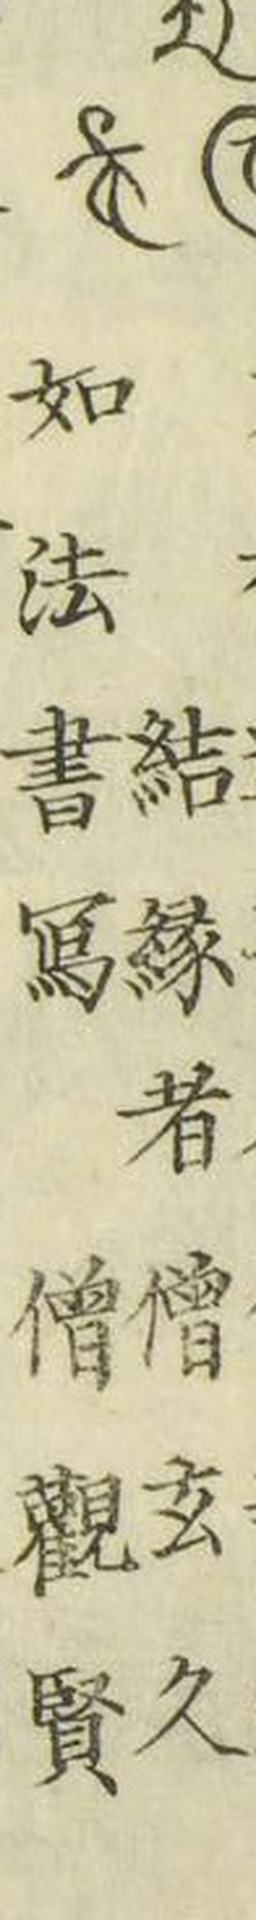如法書冩僧観賢
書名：江戸名所図会 20巻 巻之10
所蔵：東京学芸大学教育コンテンツアーカイブ
